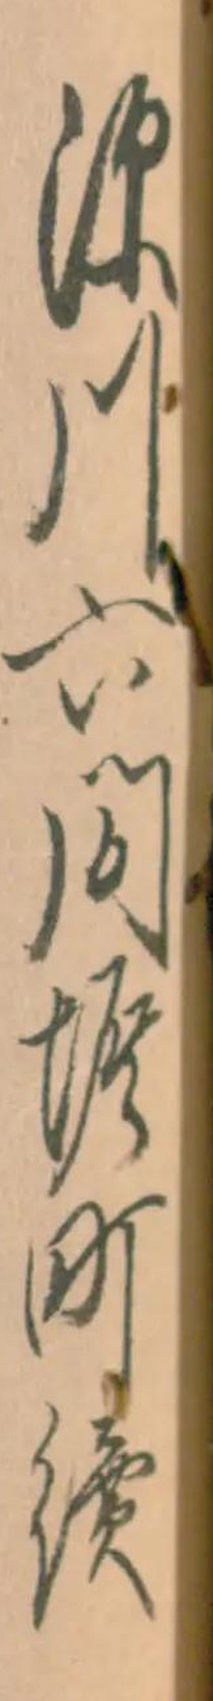深川六間堀町続
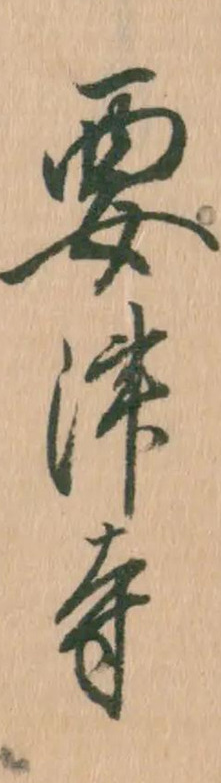要津寺
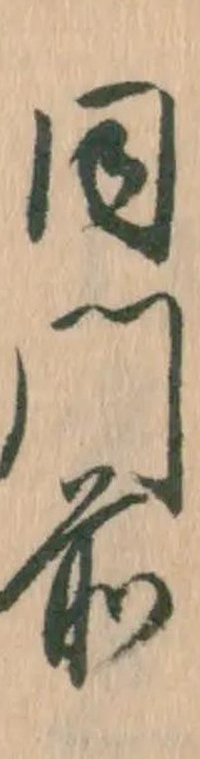同門前
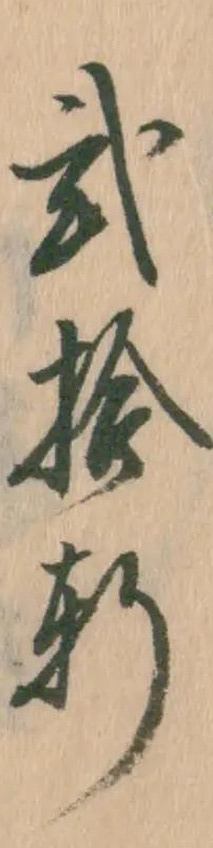弐拾軒
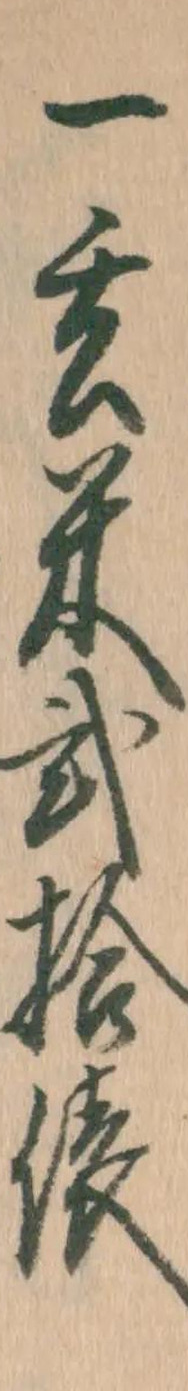一玄米弐拾俵
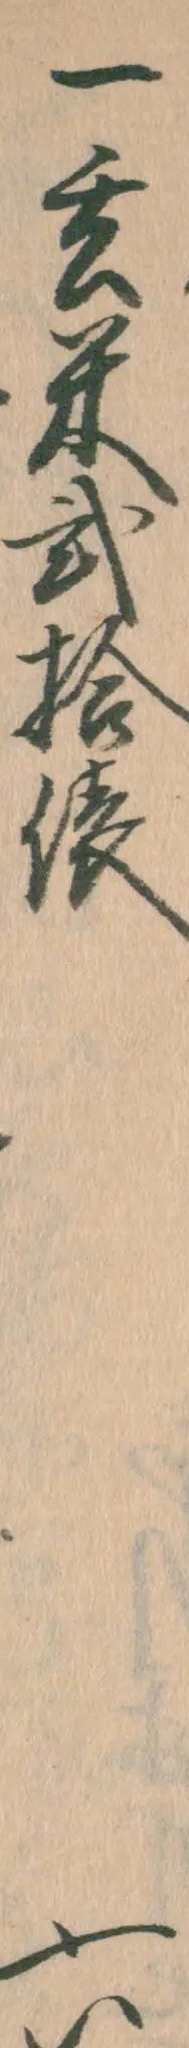一玄米弐拾俵
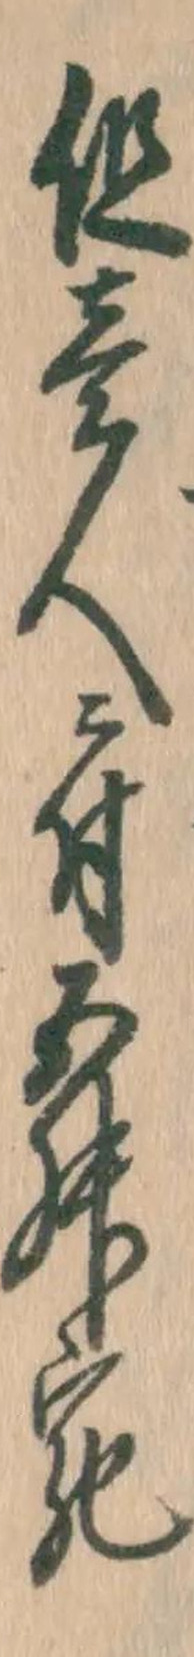但壱人ニ付五升宛
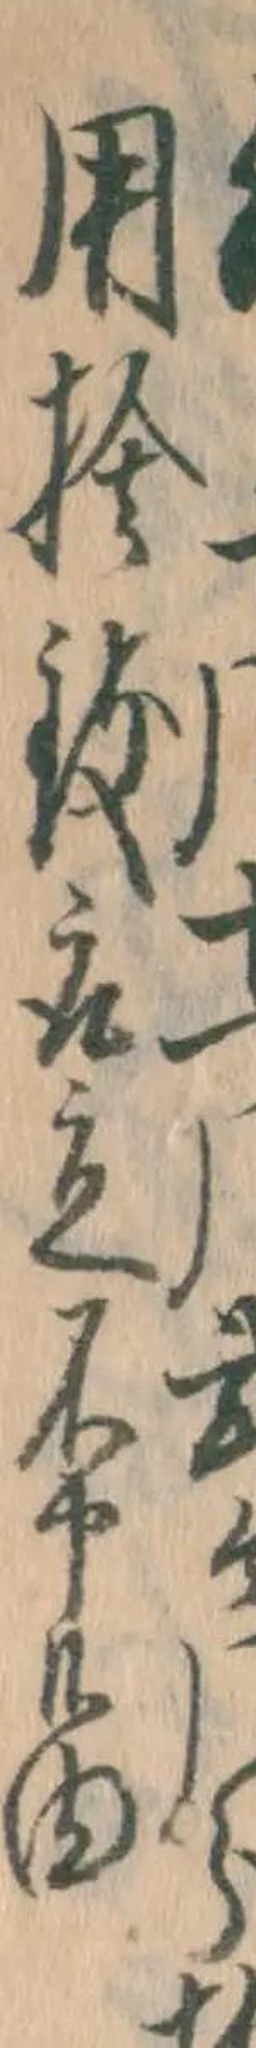用捨致取立不申候由
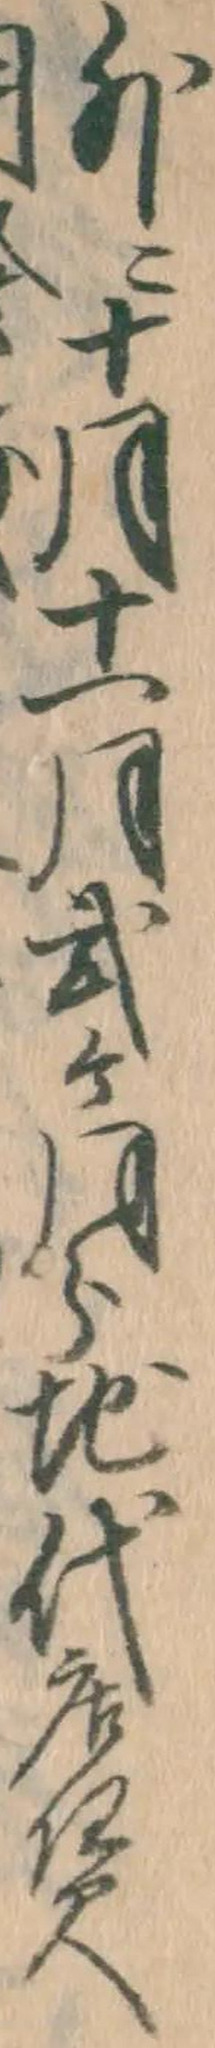外ニ十月十一月弐ケ月分地代店賃

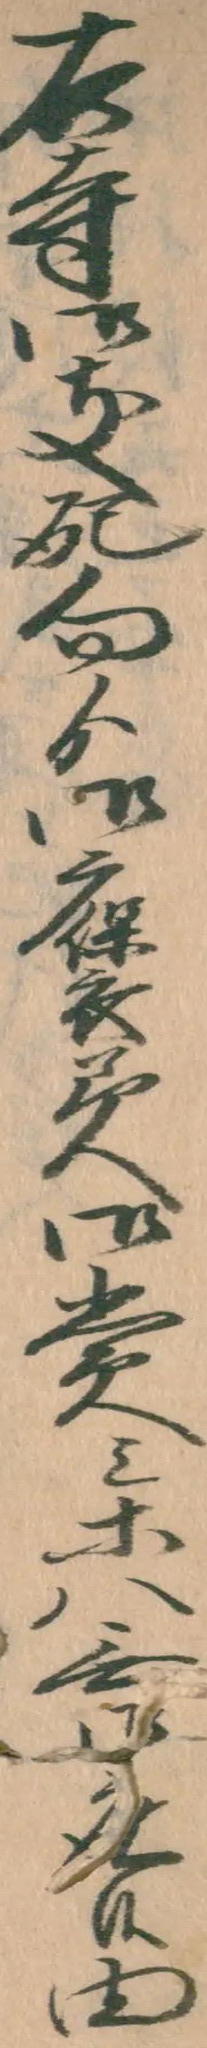右寺御支配向ゟ御褒美御賞シ等ハ無御座候由
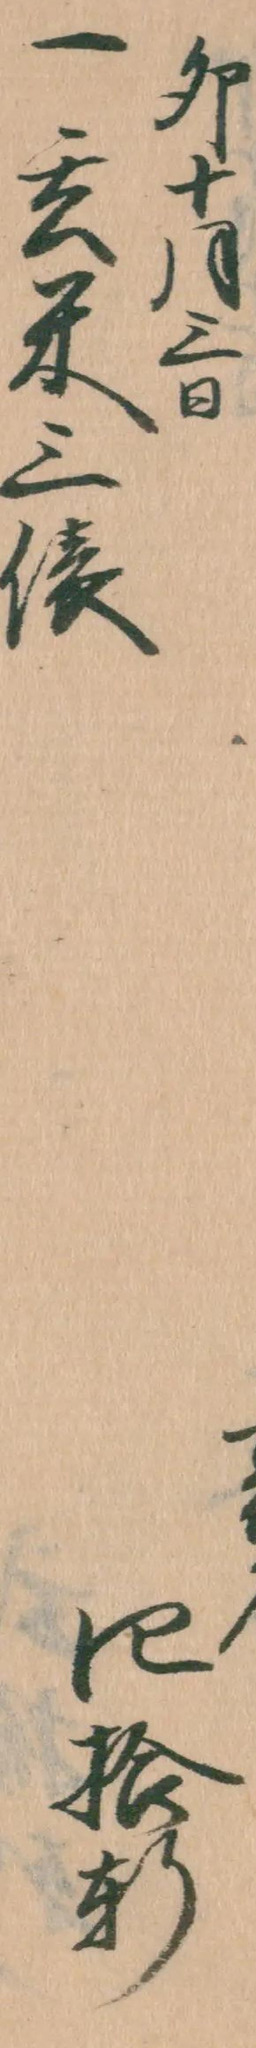一玄米三俵四拾軒
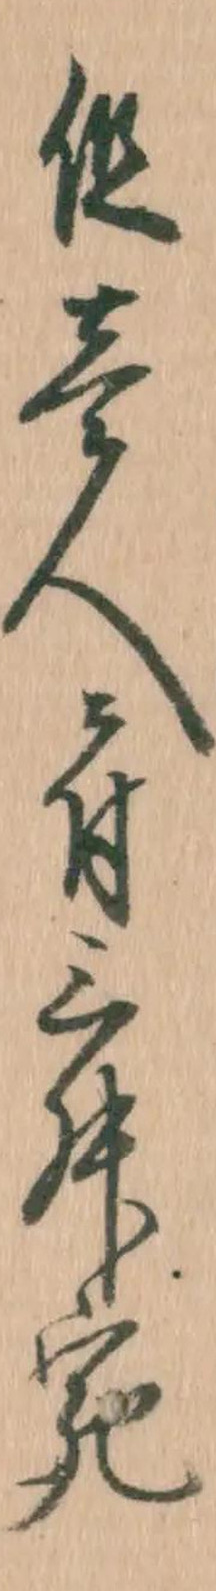但壱人ニ付三升宛
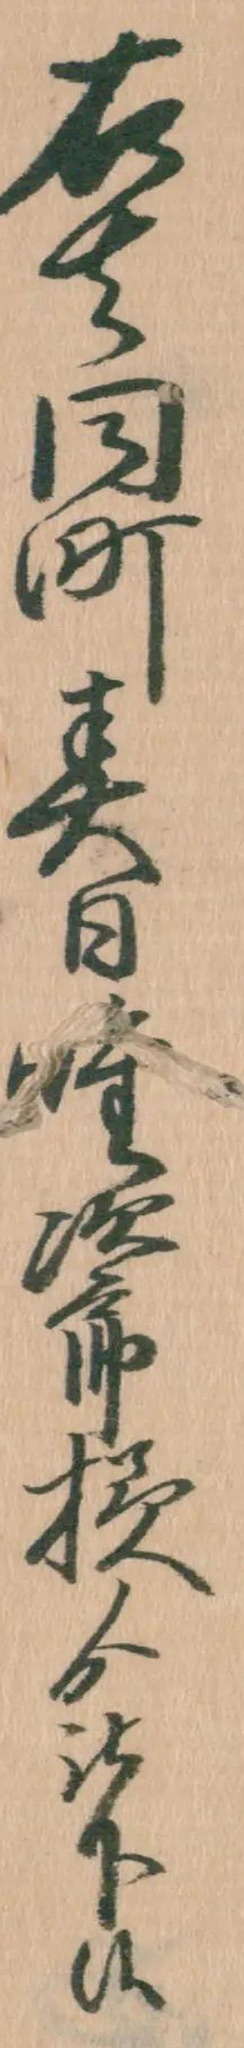右は同町春日唯次郎様ゟ被下候
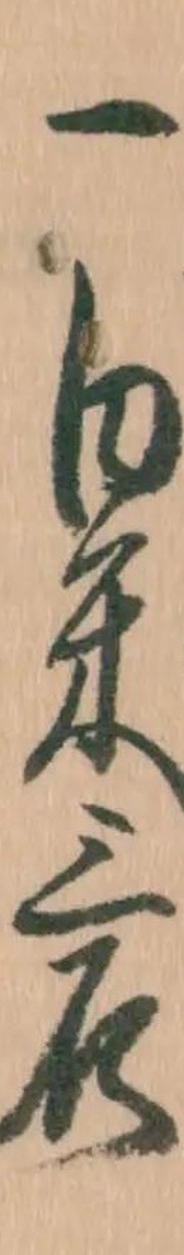一白米三石
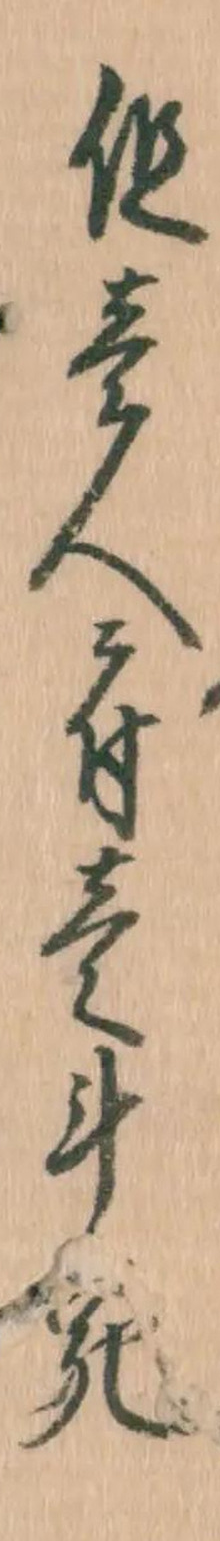但壱人ニ付壱斗宛
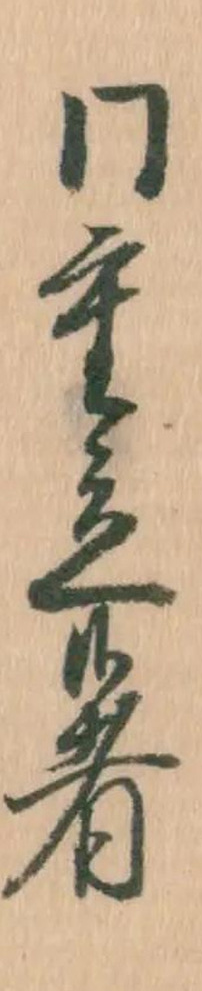同重立候者
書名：武家方并寺院等ニテ施差出候一件
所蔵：国立国会図書館 National Diet Library, JAPAN
